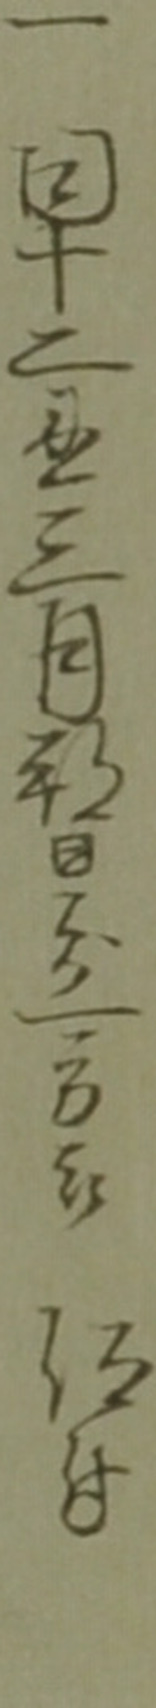一同十二丑三月朔日分一方被仰付
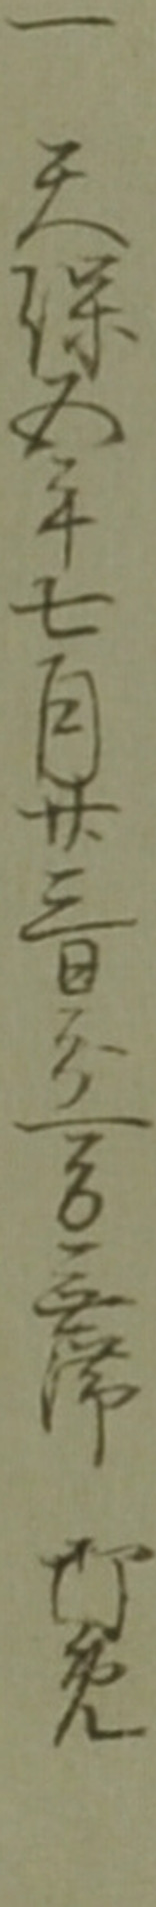一天保五午七月廿三日分一方無滞御免
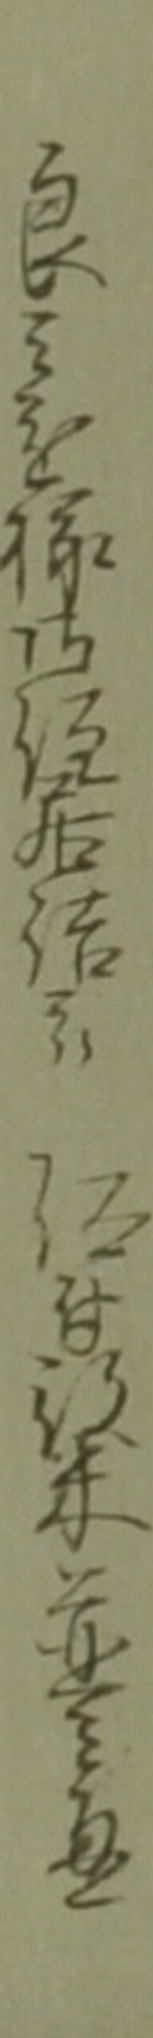良之進様御住居詰被仰付役米並之通

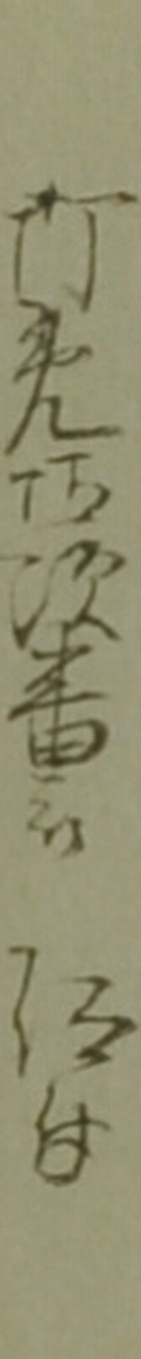御免御次番被仰付
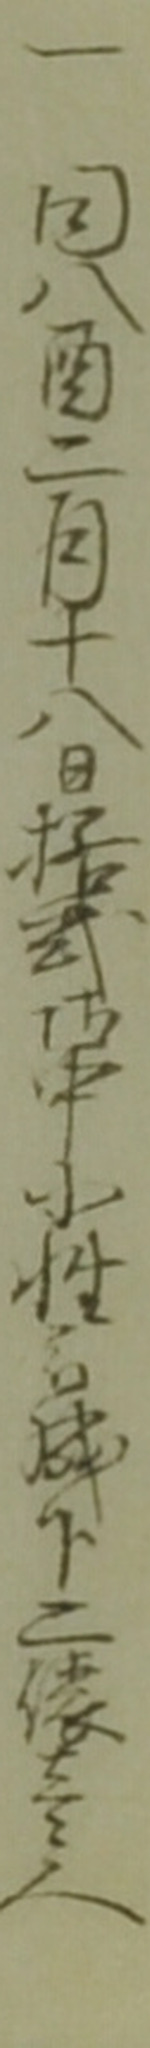一同八酉二月十八日格式御中小性被成下二俵壱人
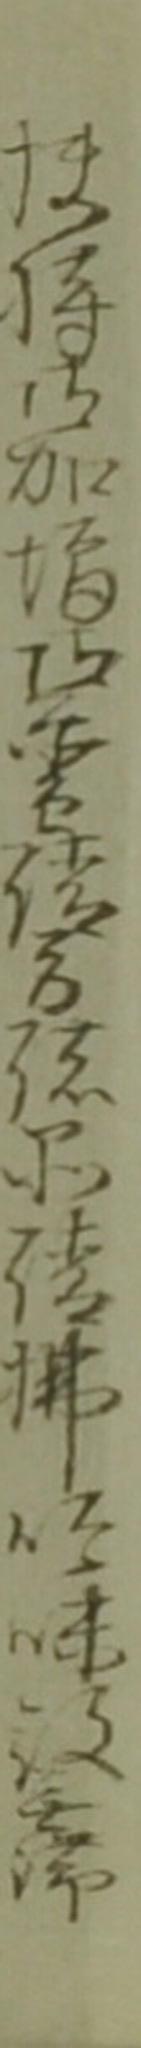扶持御加増御普請方諸所請払吟味役無滞
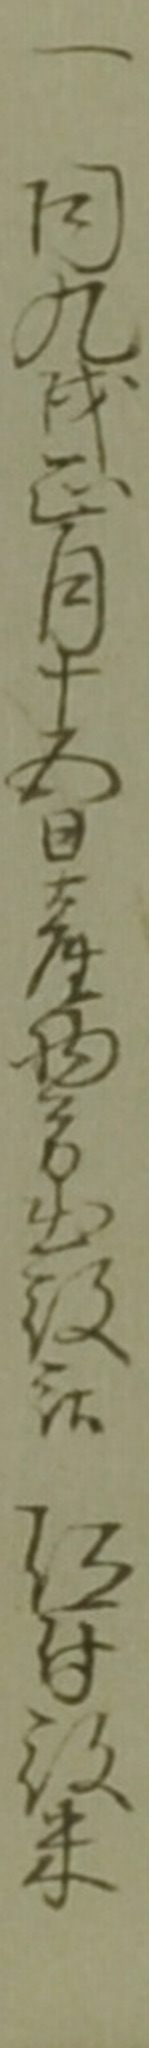一同九戌正月十五日産物方出役被仰付役米
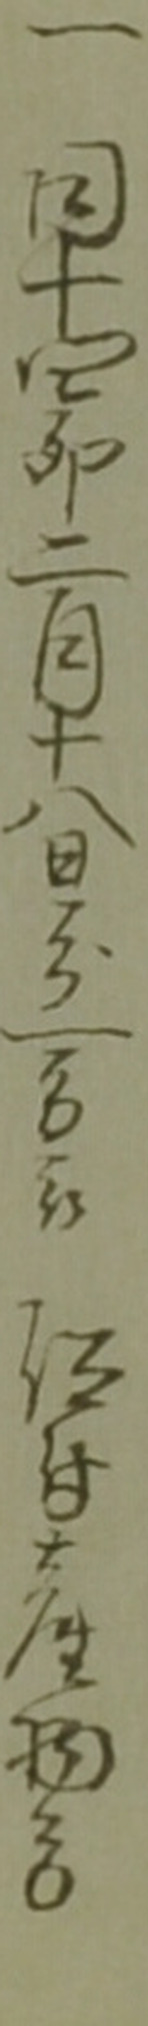一同十四卯二月十八日分一方被仰付産物方
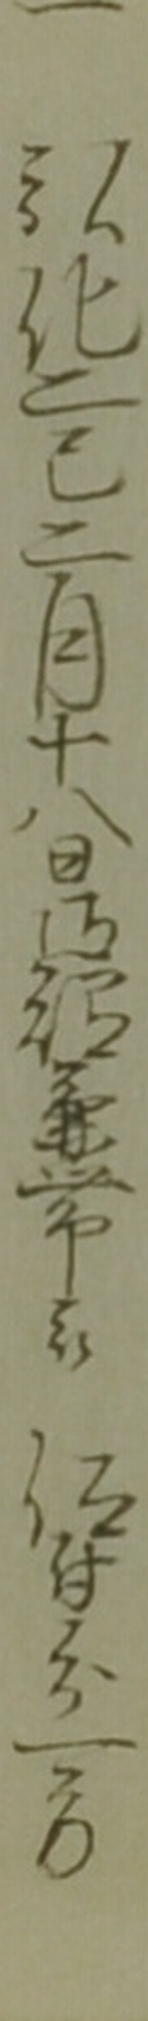一弘化二巳二月十八日御賄兼帯被仰付分一方
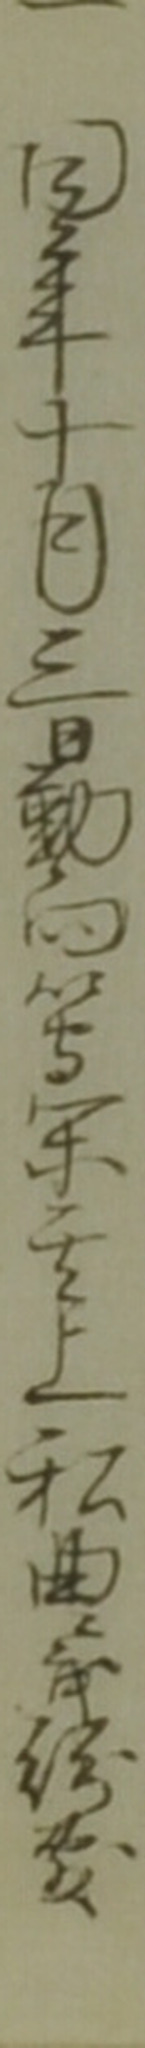一同年十月三日勤向篤実其上私曲ニ茂衛度
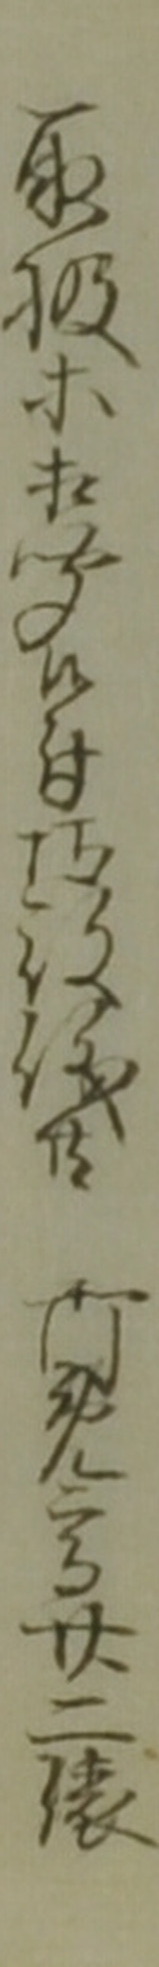取扱等相聞候付御役儀共御免高廿二俵
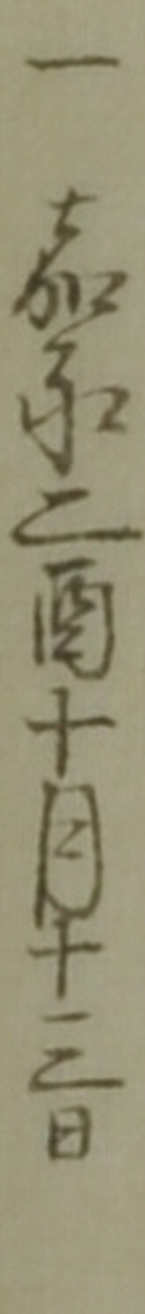一嘉永二酉十月十三日
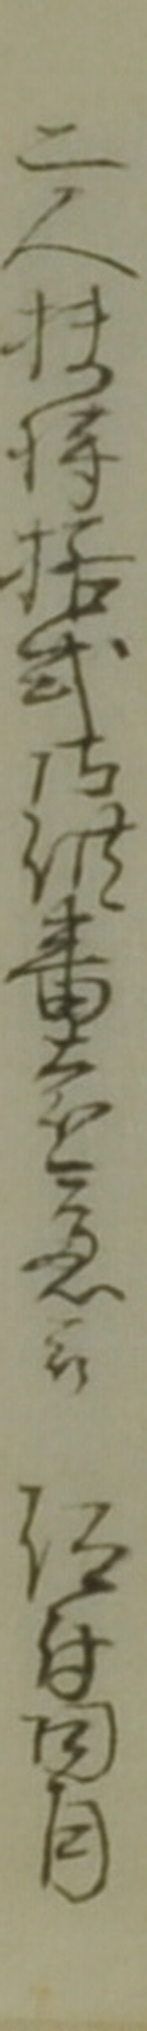二人扶持格式御供番遠慮被仰付同月
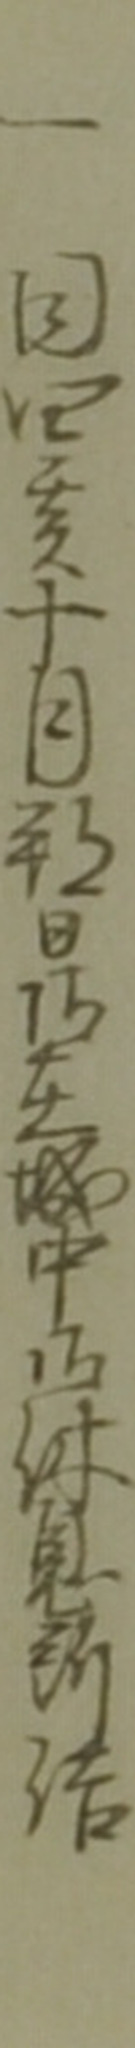一同四亥十月朔日御在城中御休息所詰
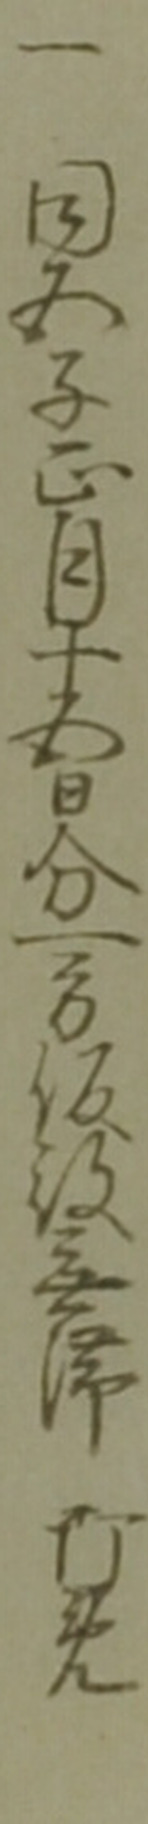一同五子正月十五日分一方仮役無滞御免
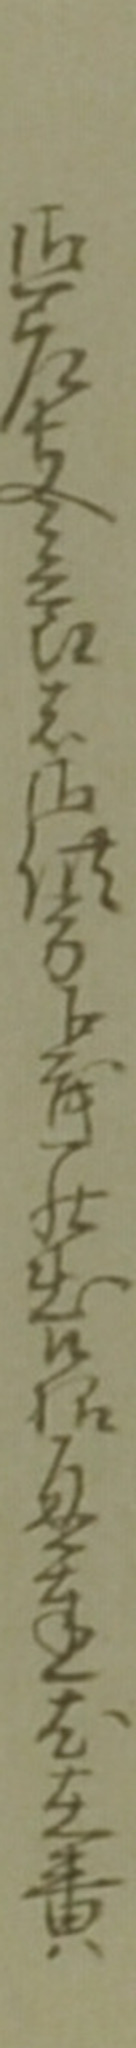御差支之節志御供方江茂罷出候様通達尤在番ハ
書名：無足諸士勤仕録（三）
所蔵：伊那市立高遠町図書館・合同会社AMANE
